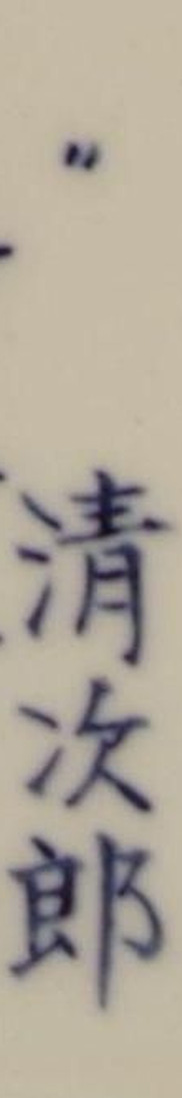清次郎
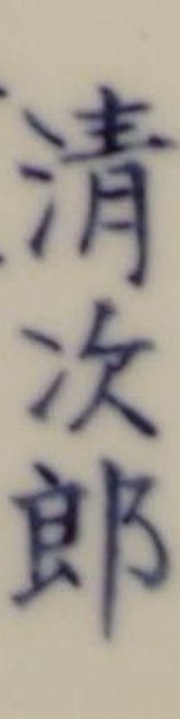清次郎
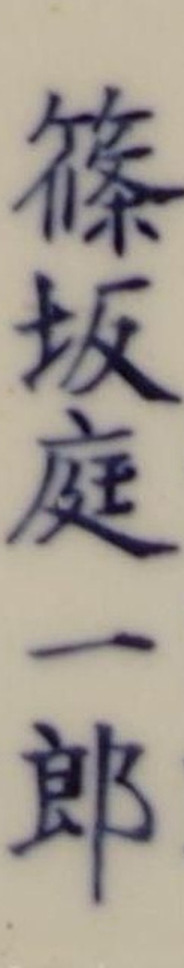篠坂庭一郎
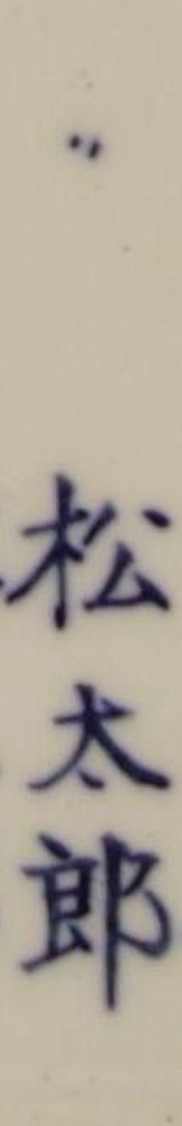松太郎
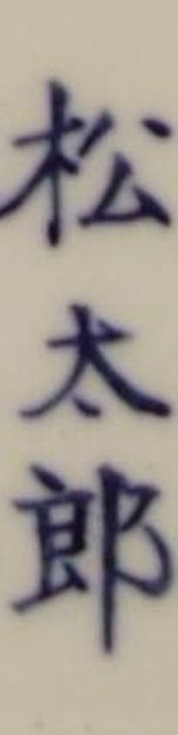松太郎
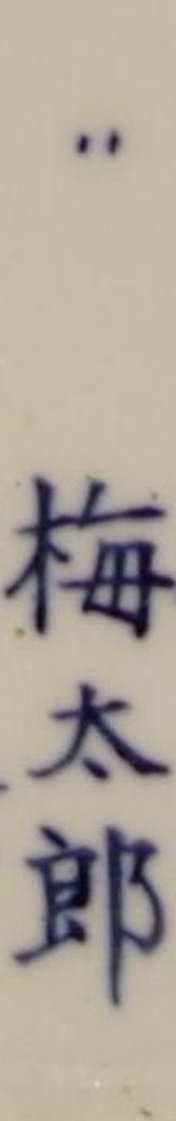梅太郎
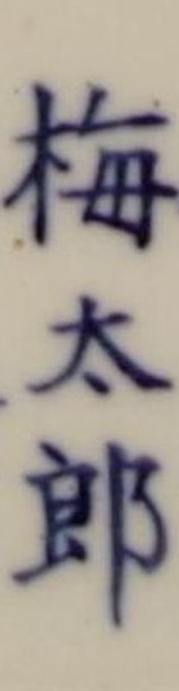梅太郎
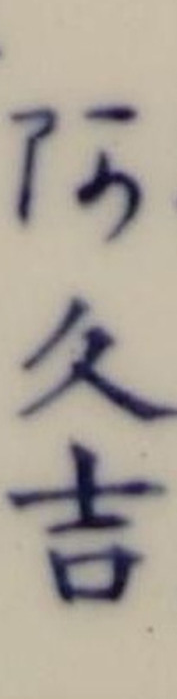あ久吉
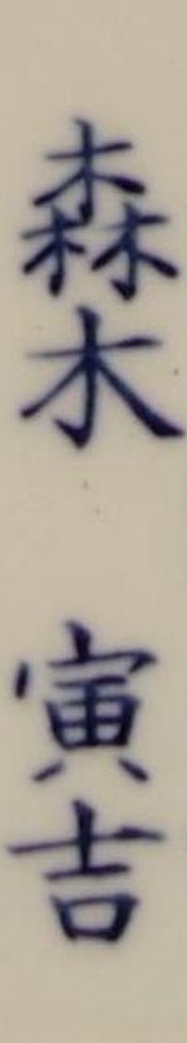森木寅吉
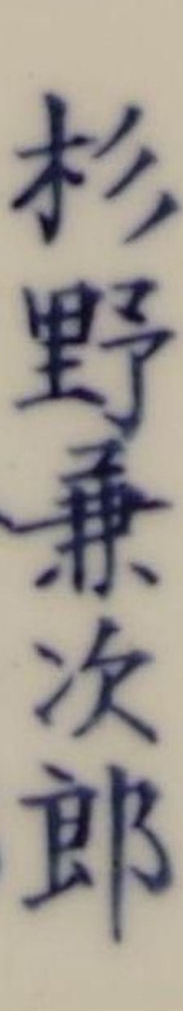杉野兼次郎
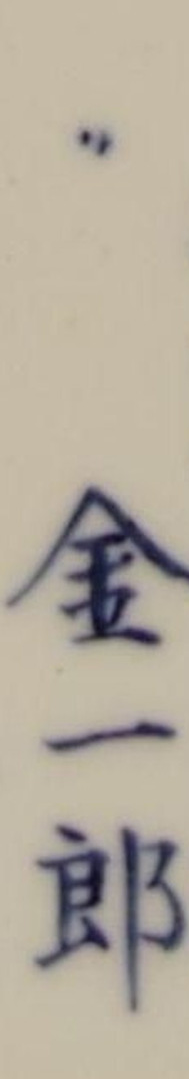金一郎
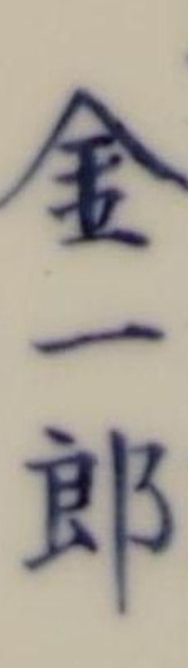金一郎
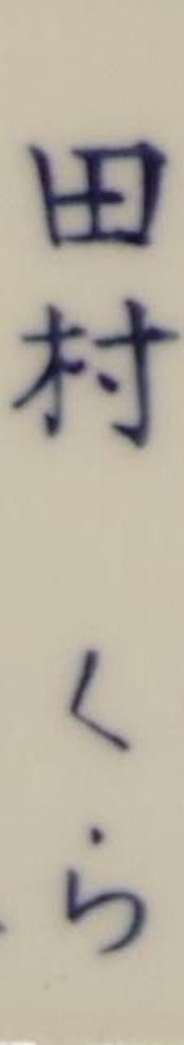田村くら
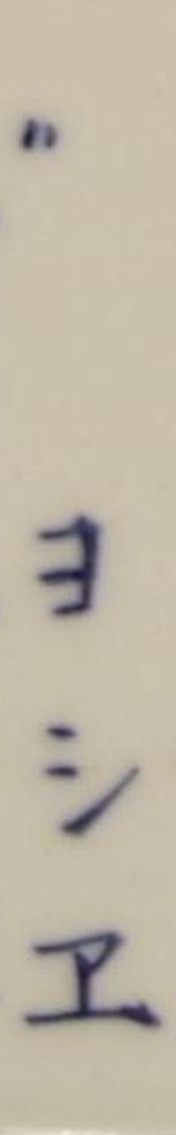ヨシエ
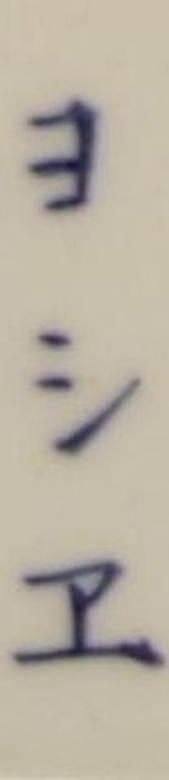ヨシエ
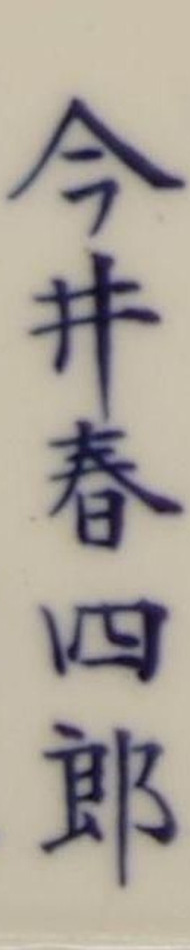今井春四郎
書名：E~L
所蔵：高野山金剛峯寺
